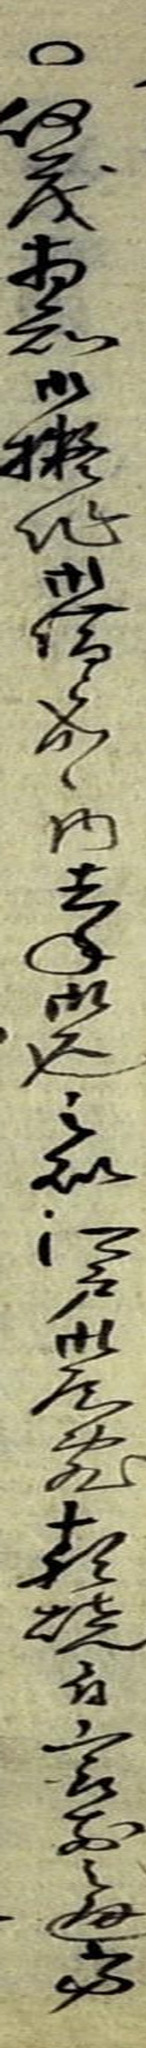〇何茂拝知御擬作御借被成候内去年御返之処江戸御屋敷類焼ニ付最前之通当
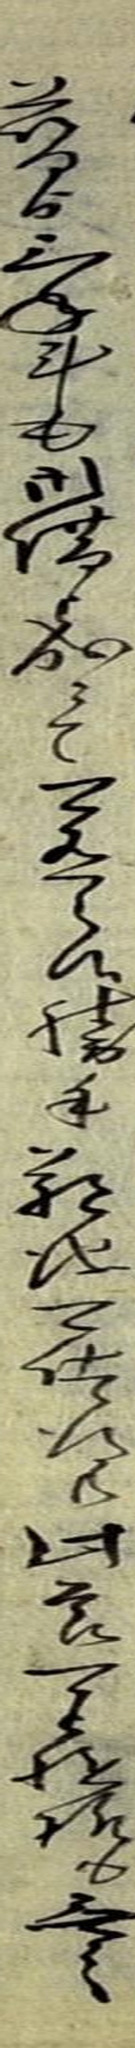暮ゟ三年斗も御仮御借被成ニて可有之候勝手難儀可仕候得共此節可被遊様も無之
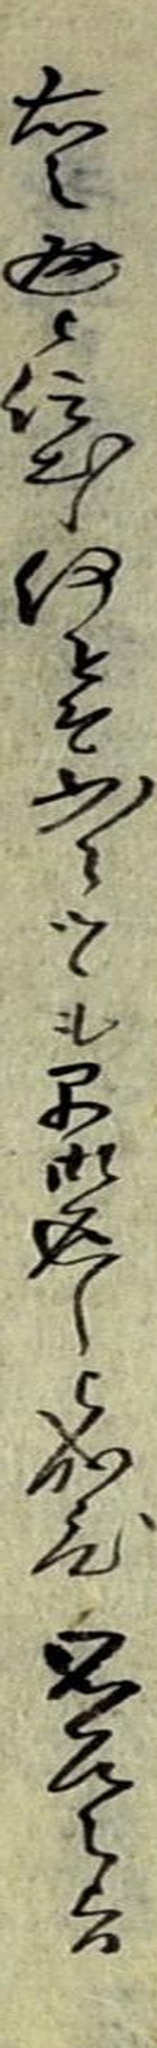右之通被仰出候何とそ少々ツヽも早御返し被成度思召之旨
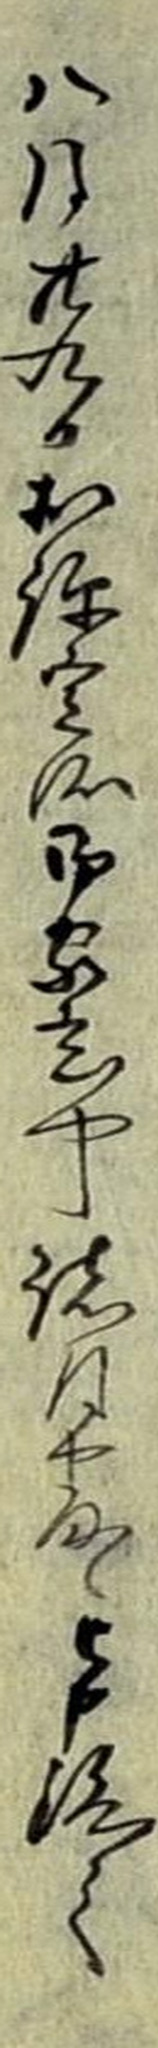八月廿九日於評定所御家老中諸月番へ被申渡之
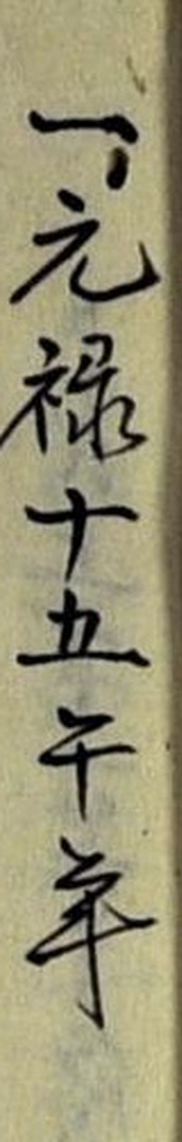一元禄十五午年
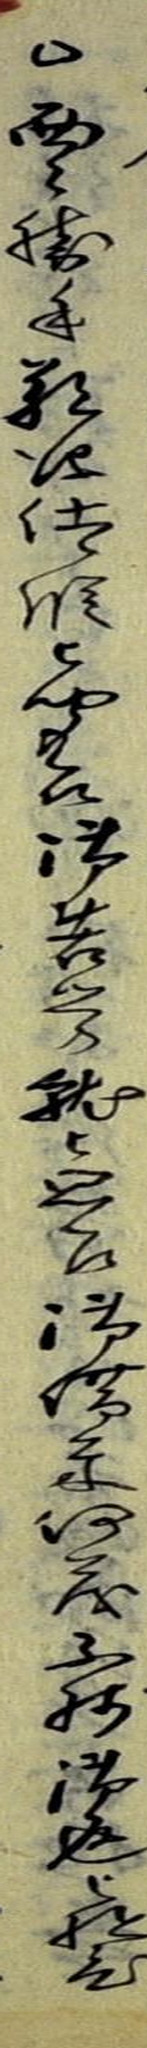〇面々勝手難儀仕候段被聞召御苦労就被思召御借米何茂不残御返被遊度
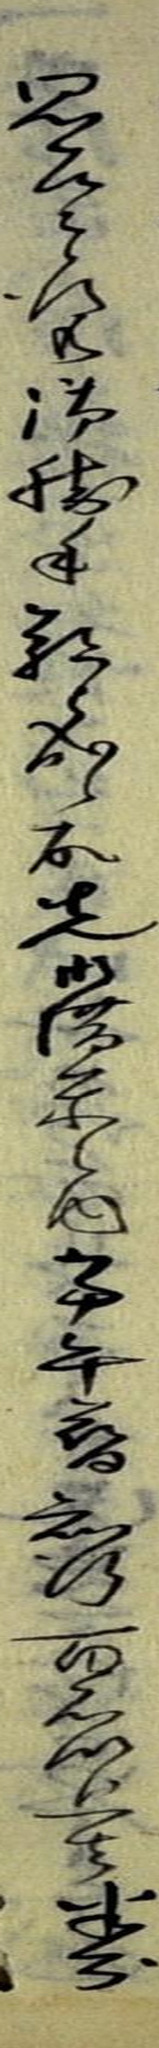思召候得共御勝手難被成候故先御借米之内当午暮知行百石以上者半分
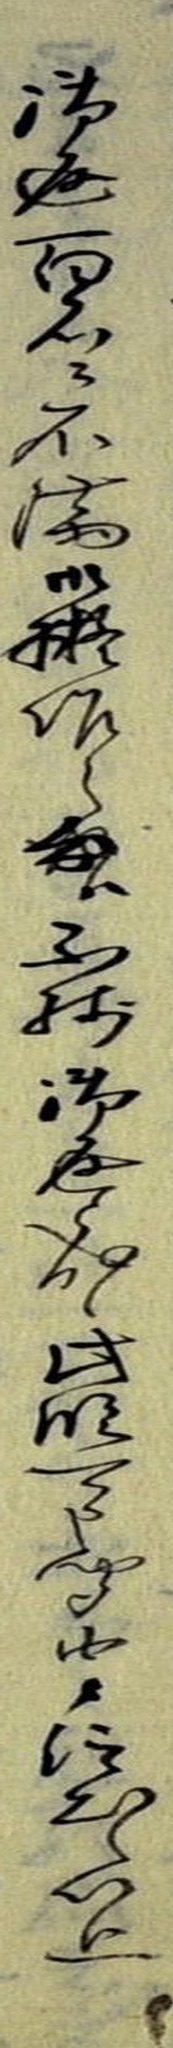御返百石ニ不満御擬作之分ハ不残御返被成候此段可申聞由被仰出候以上
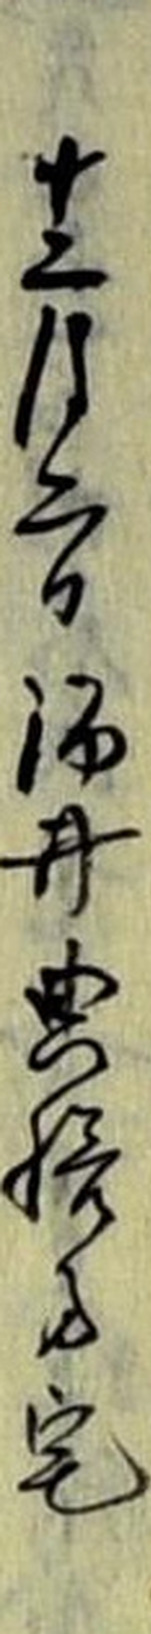十二月二日酒井典膳方宅

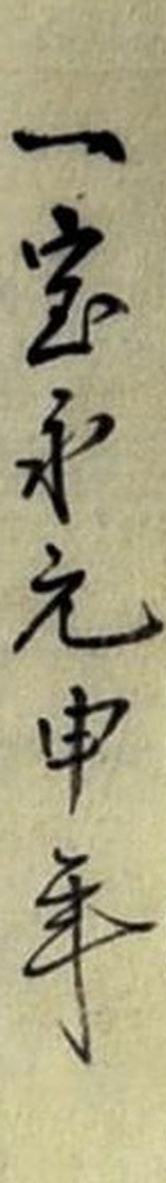一宝永元申年
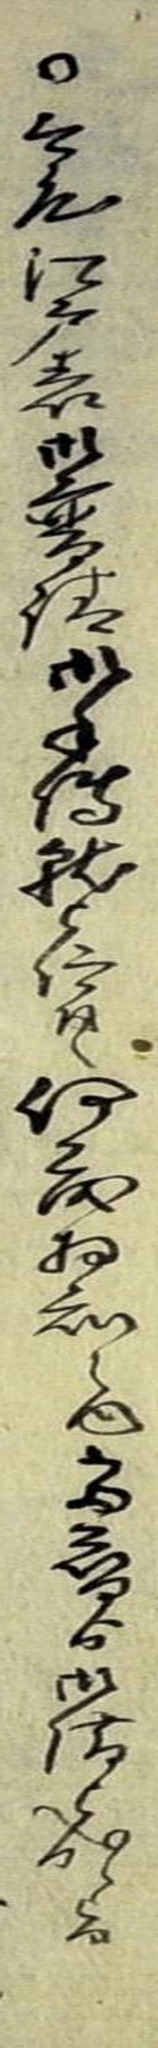〇今度江戸表御普請御手伝就被仰付候何茂拝知之内当暮ゟ御借被成候旨
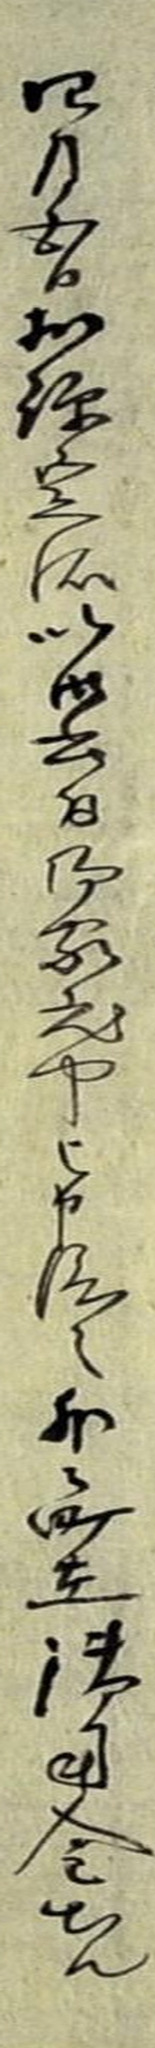四月五日於評定所以御書付御家老中被申渡之外ニ町在御用金出ル
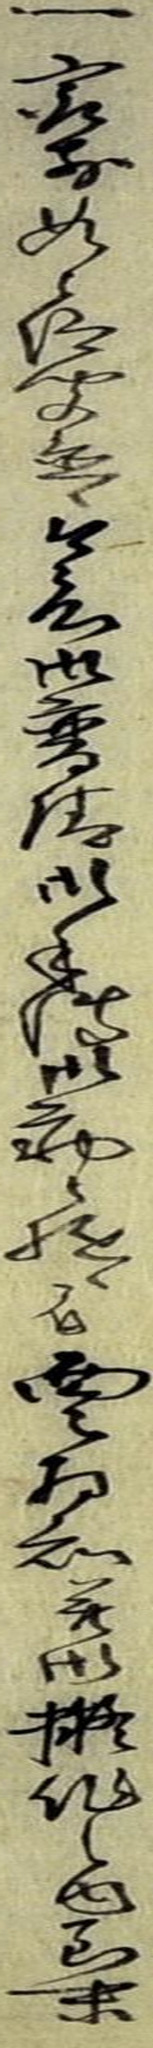一最前如被仰聞置候今度御普請御手伝御勤被遊候ニ付面々拝知并御擬作之内至末
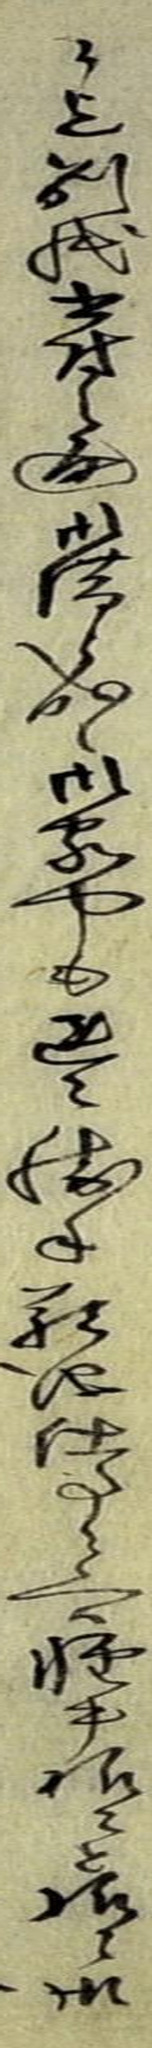々迄別紙書付之通御借被成候御家中も連々勝手難儀仕事ニ候ヘハ軽キ様ニと様々御
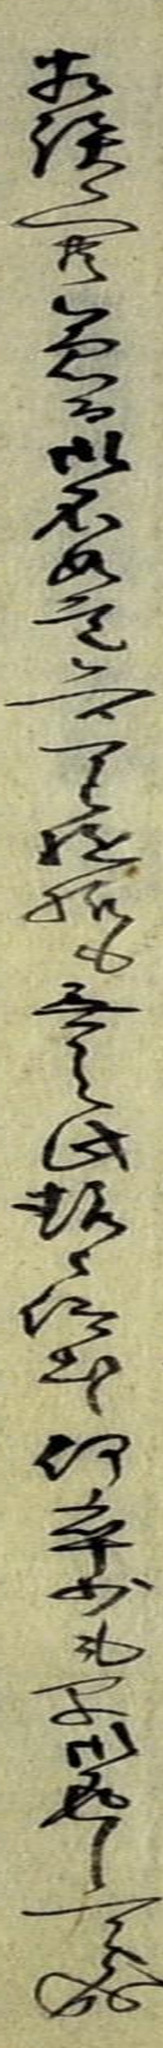相談候へ共兼而御不如意候ヘハ可被遊様も無之此趣被仰出候何卒少も早御返し可被成
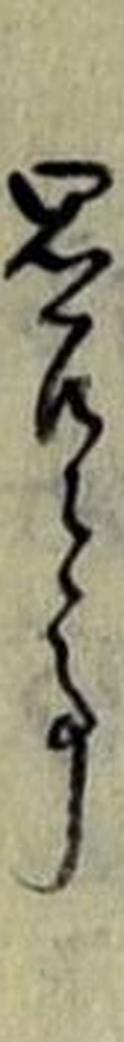思召之事
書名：命令之部 一
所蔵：福井県文書館 Fukui Prefectural Archives
